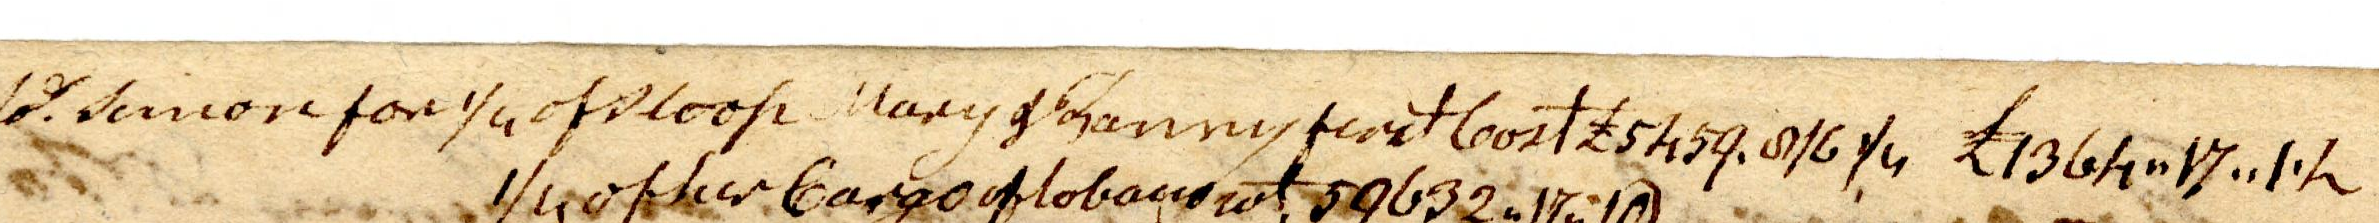p^d. Seniore for 1/4 of sloop Mary & Fanny port Cost £5459.8s 6 1/4 £1364..17..1 1/2
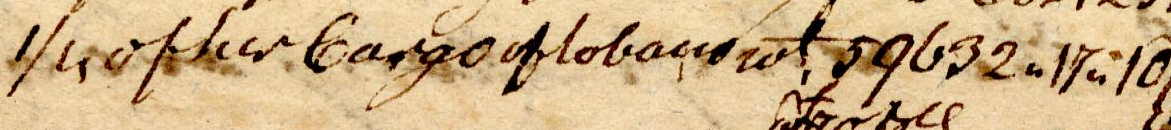1/4 of her Cargo of tobacco ro^t. 59632..17..10
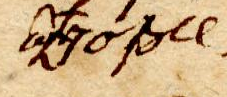£70 p^ce
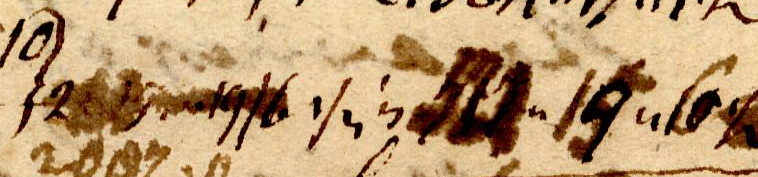2.15..19s6 1/4 is 14..19..10 1/2
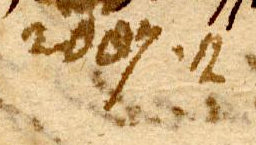2087.12
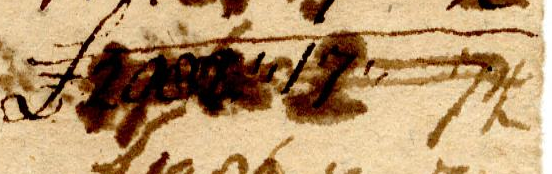£1982..17..7 1/2
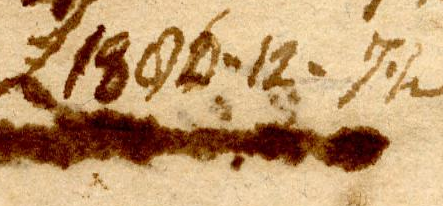£1882..12.7 1/2
